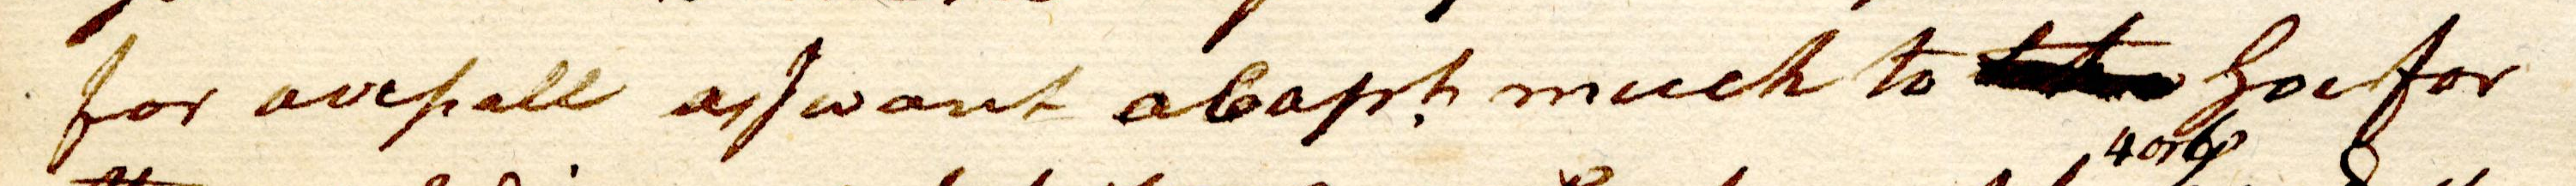for a vessall as I want a Cap^t much to [____] Goe for
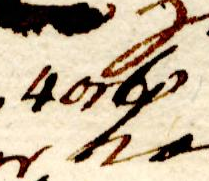4 or 6
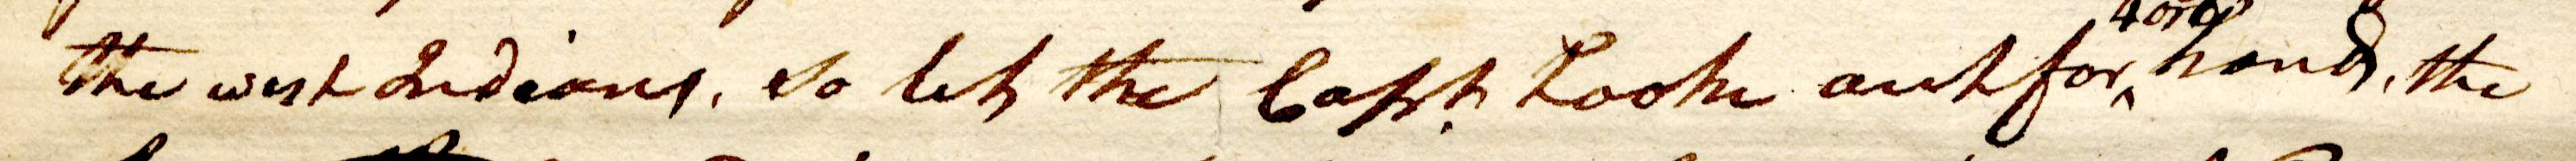the West Indians, so let the Cap^t Looke are for ^ hand, the
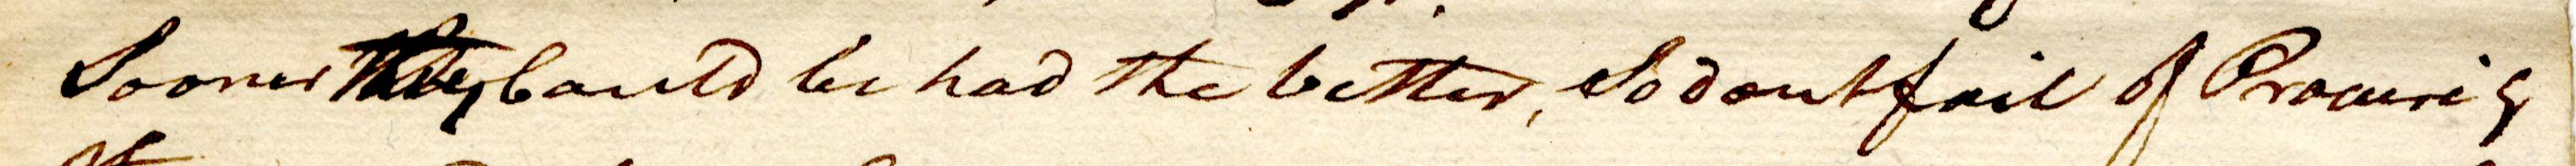Sooner they Could be had the better, so dont fail of Procure'g
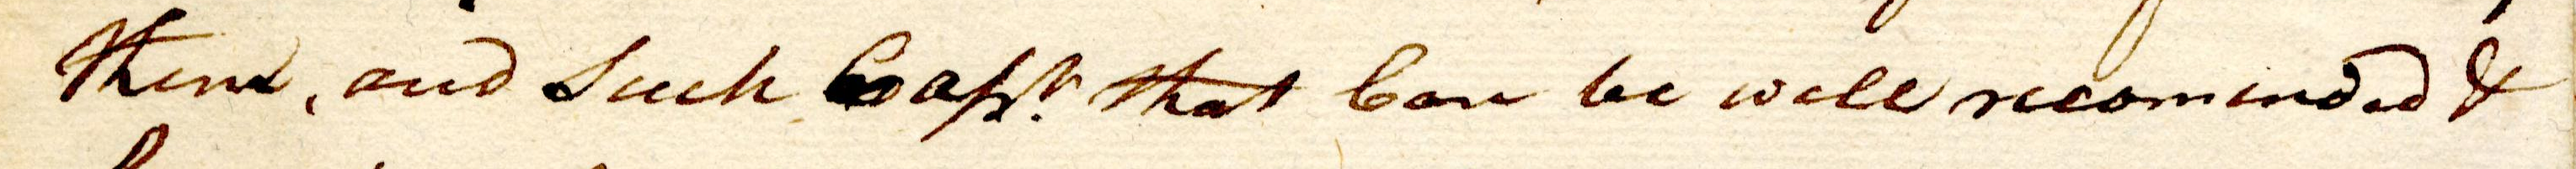them, and Such Cap^t that Can be well recomended &
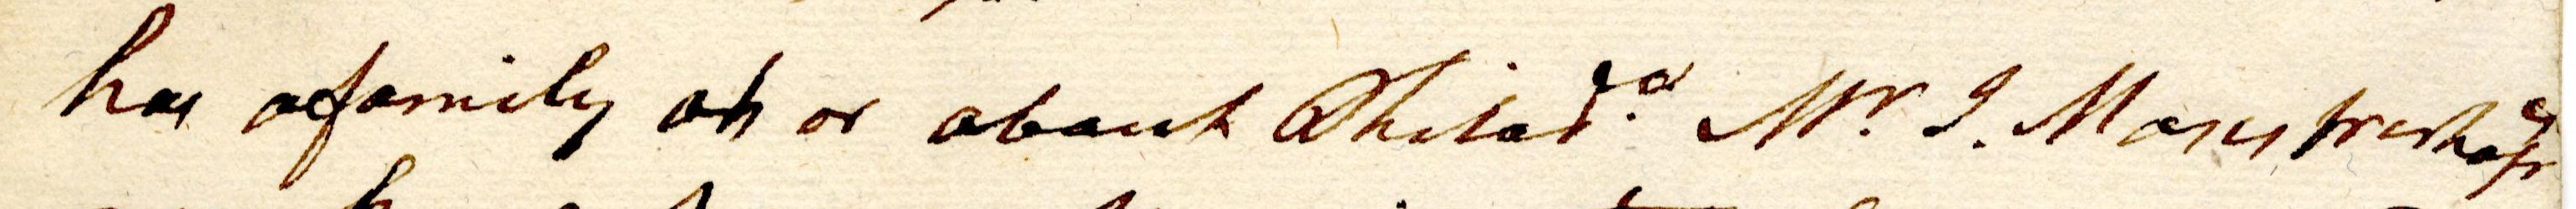has a family at or about Philad^a M^r I. Moses Franks
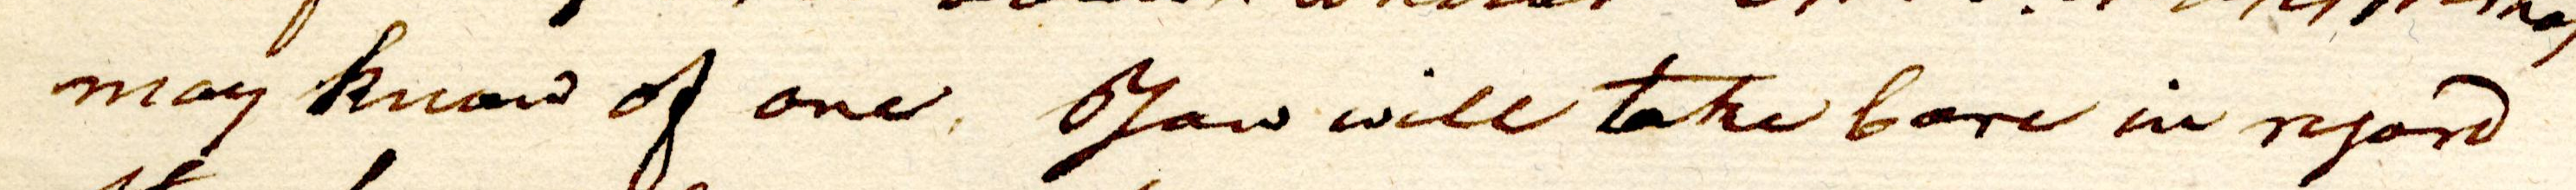may know of one, You will take Care in regard
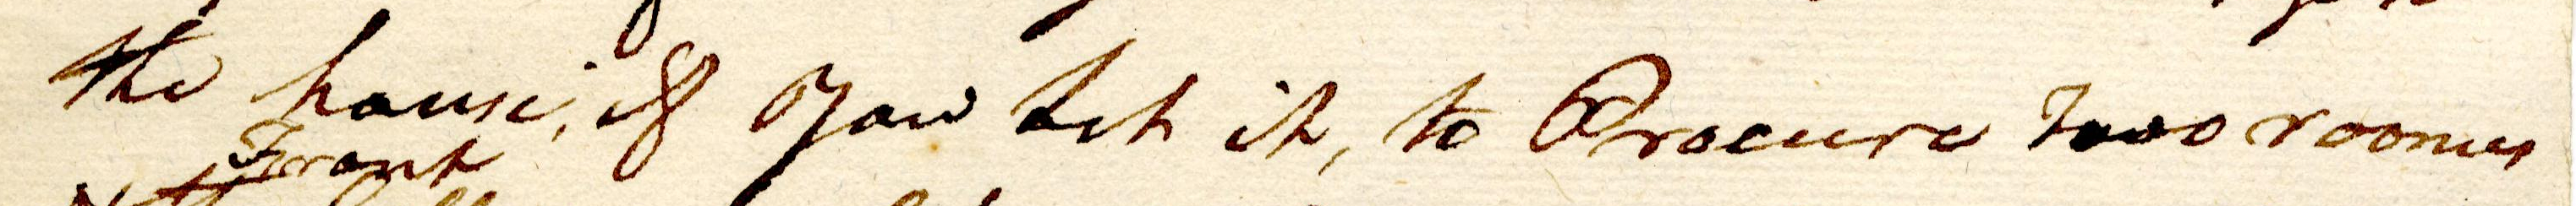the house if you Let it, to Procure two rooms
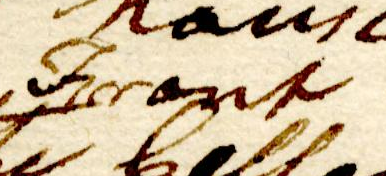Frank
